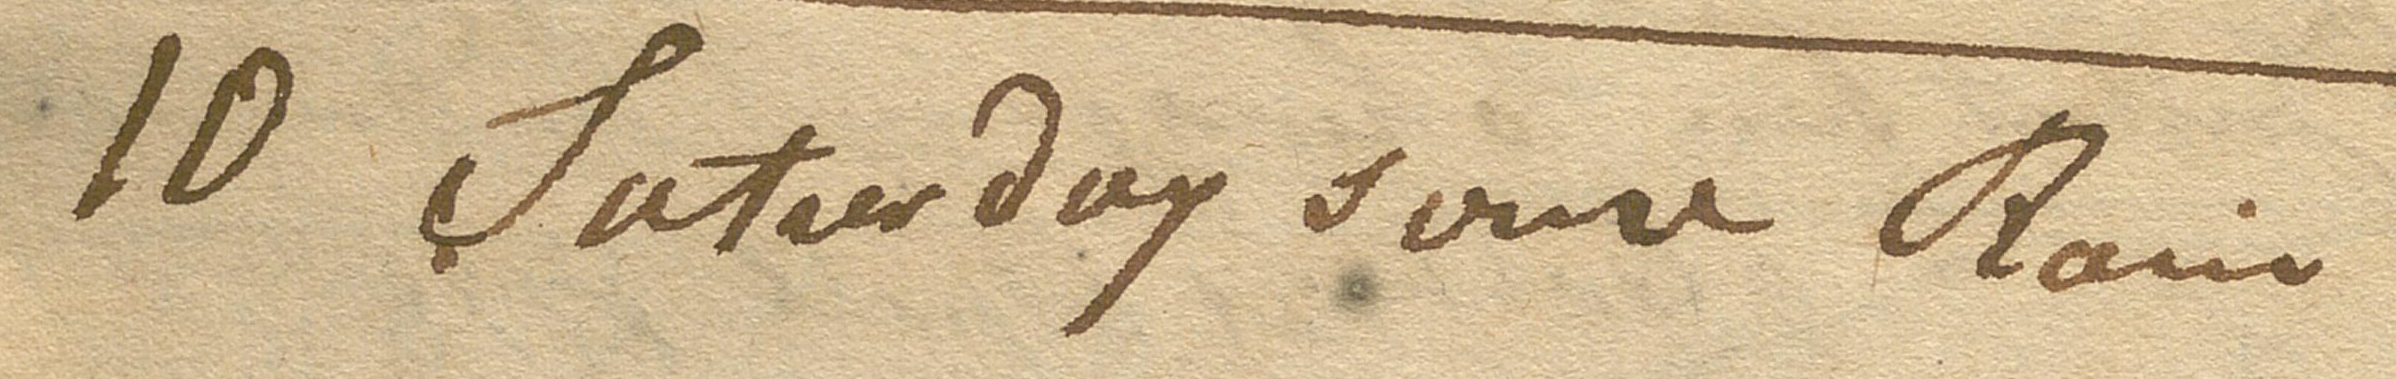10 Saturday some Rain
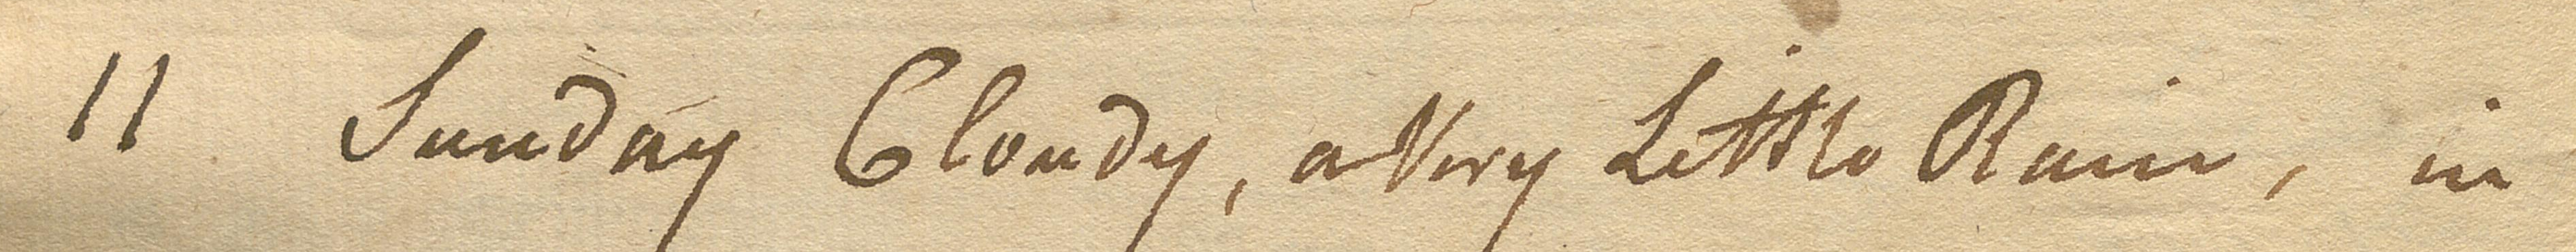11 Sunday Cloudy, a Very Littte Rain, in
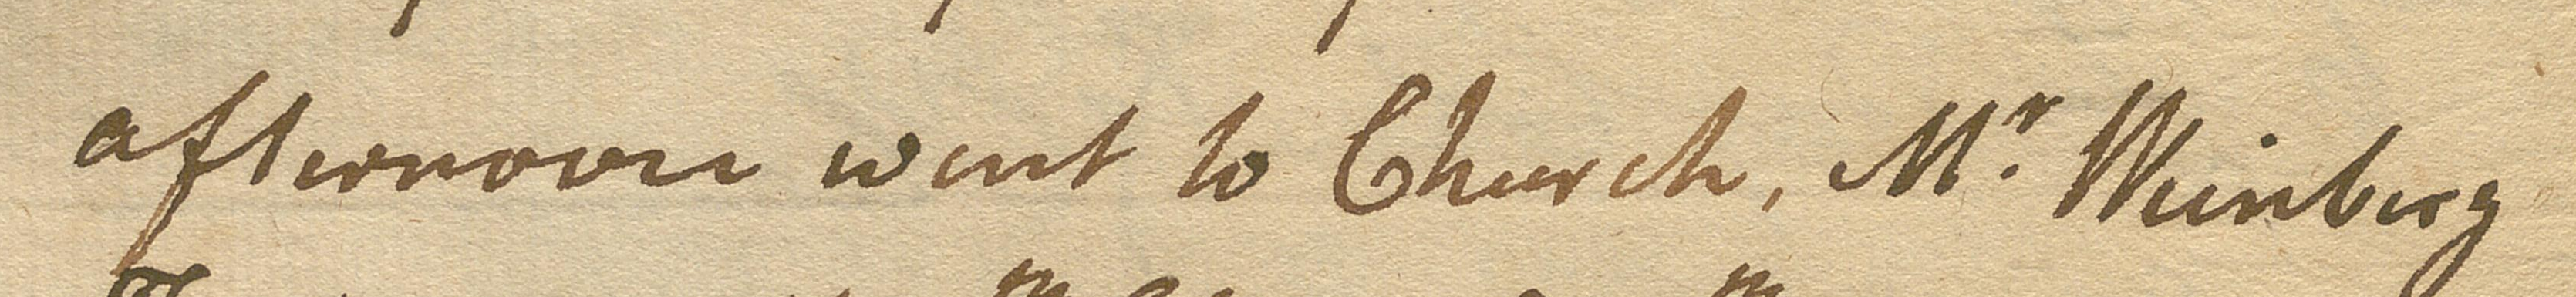afternoon went to Church, M^r. Weinberg
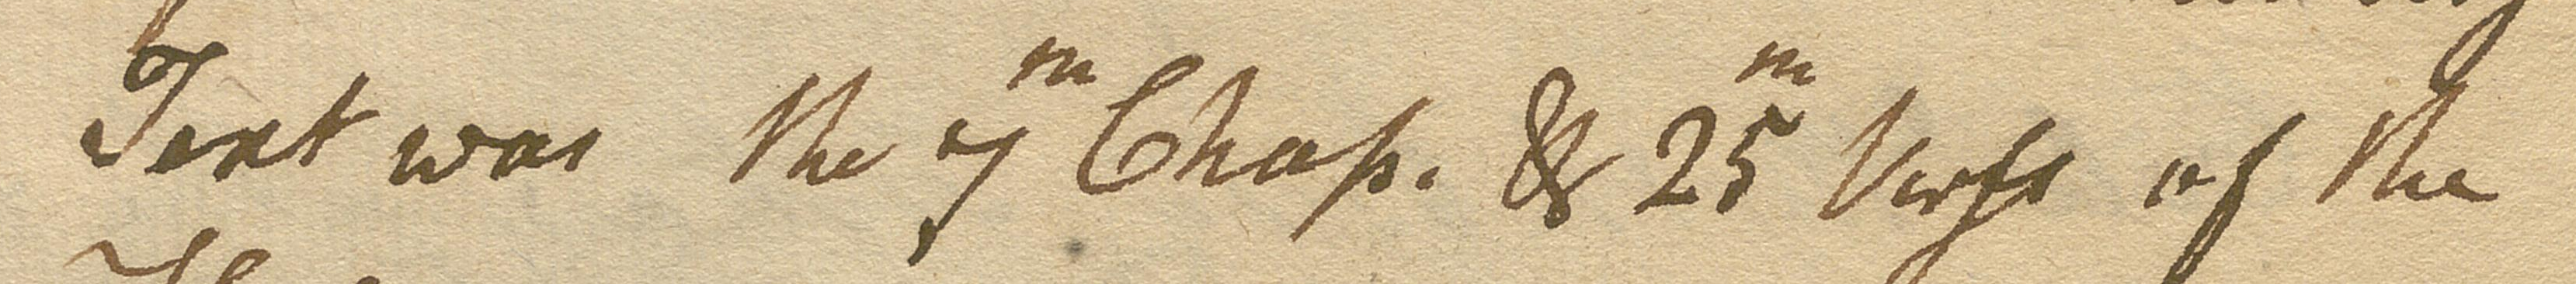Text was the 7^th Chap. & 25^th Verss of the
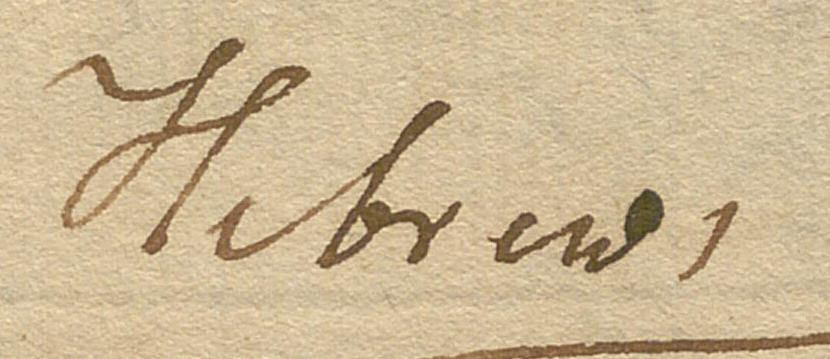Hebrews
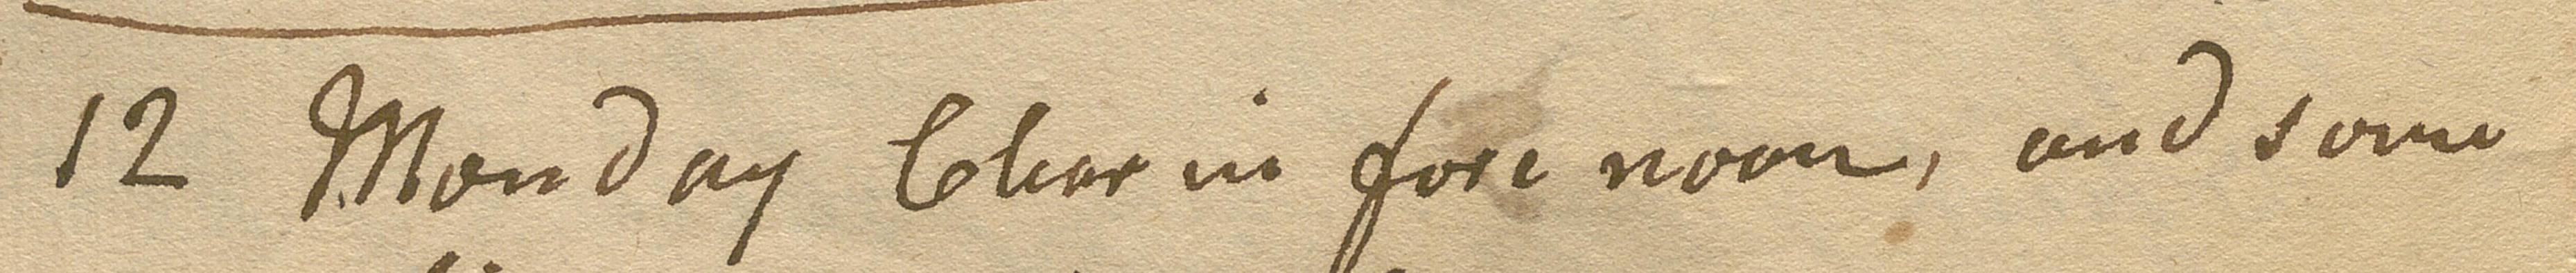12 Monday Clear in fore noon, and some
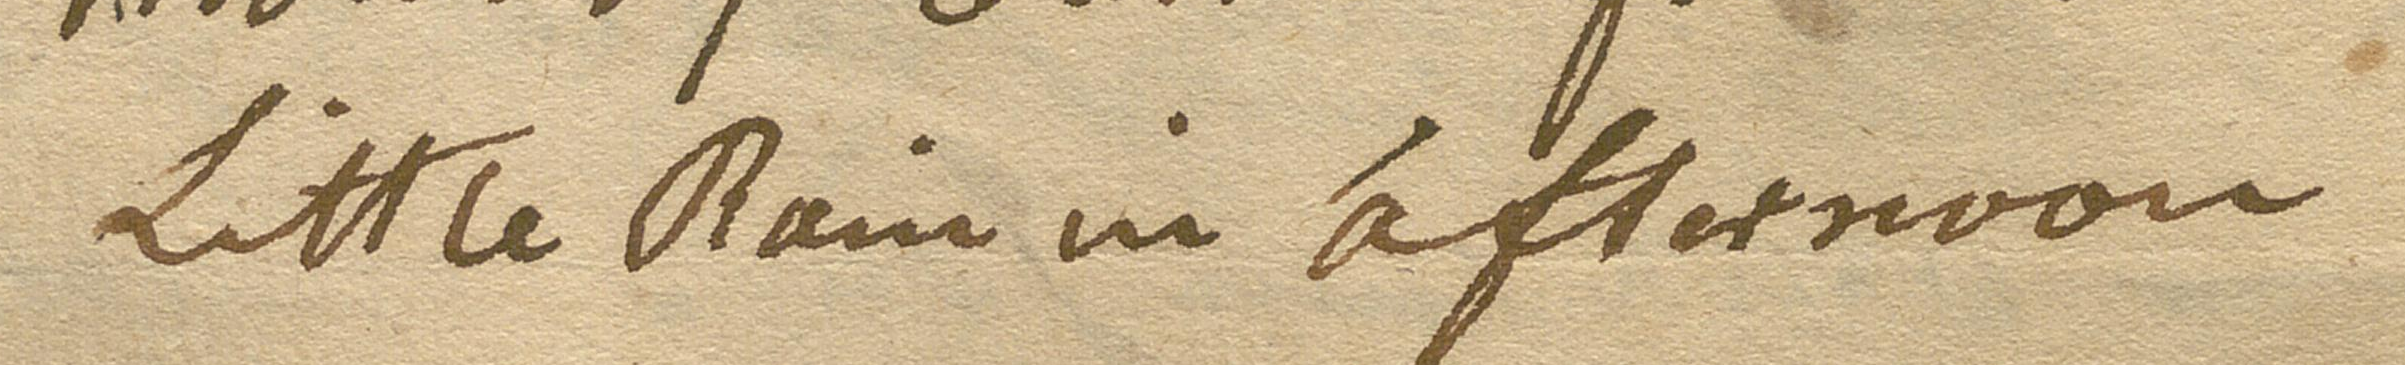Little Rain in afternoon
